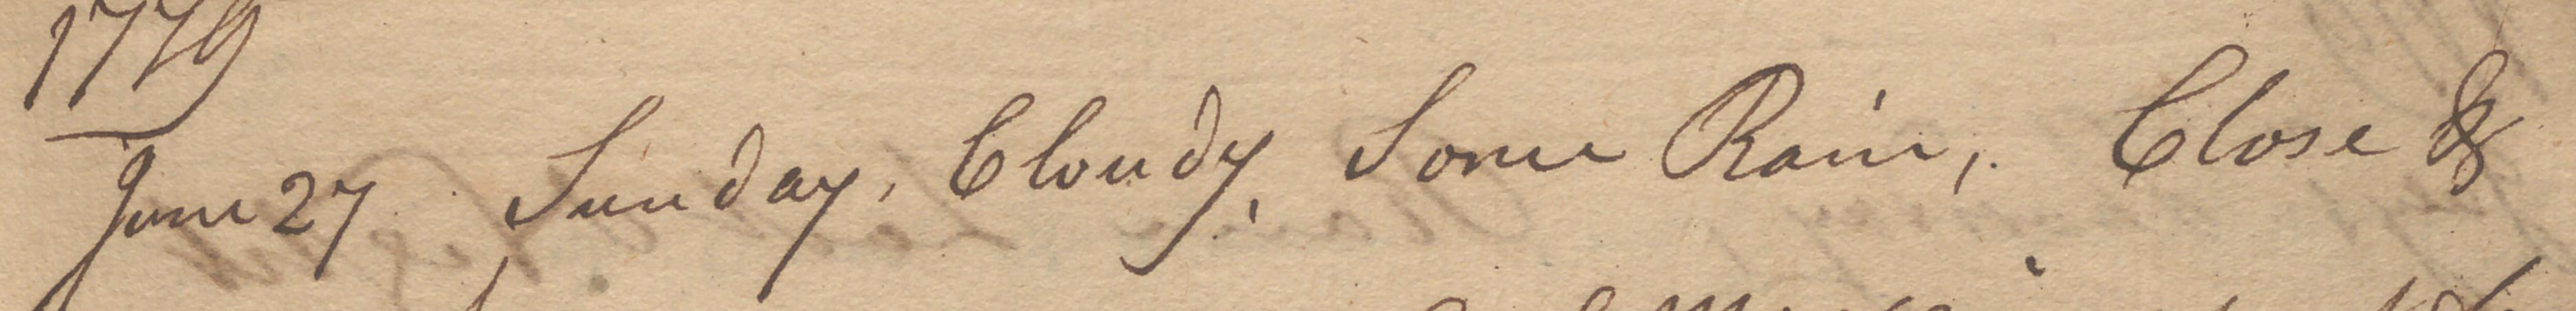June 27 Sunday Cloudy Some Raine, Close &
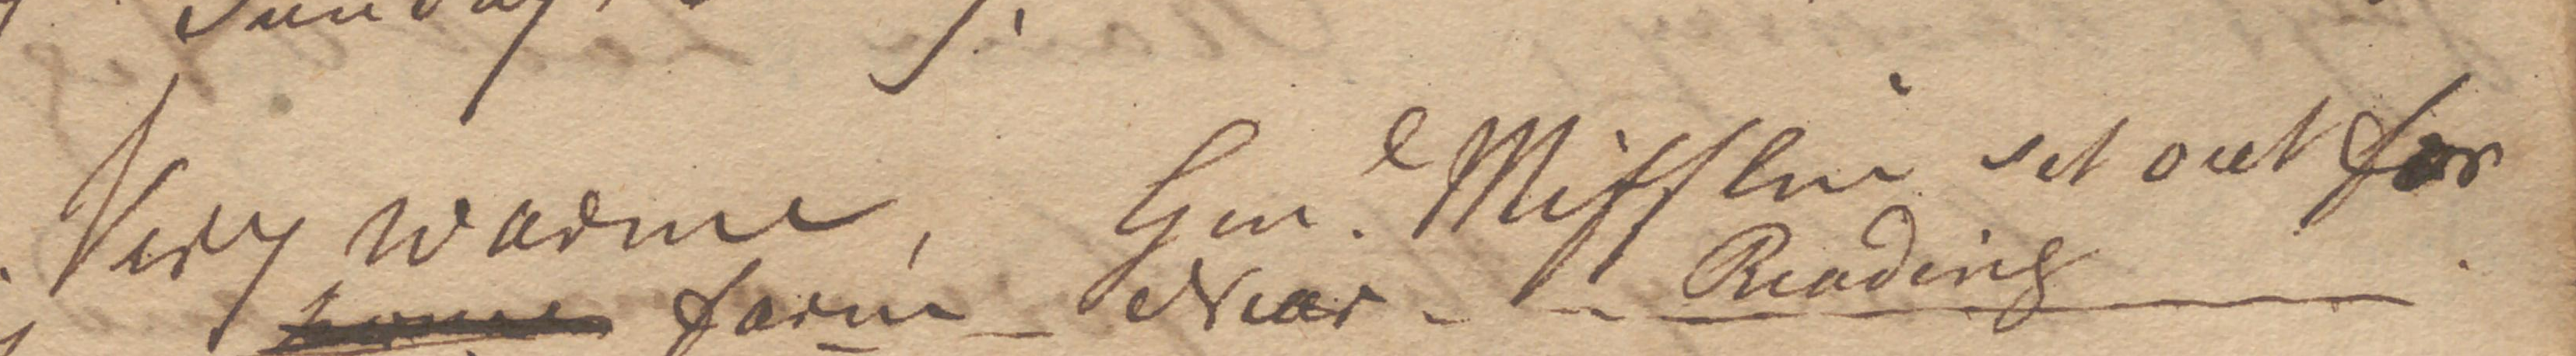Very warme, Gen^l. Mifflin set out for
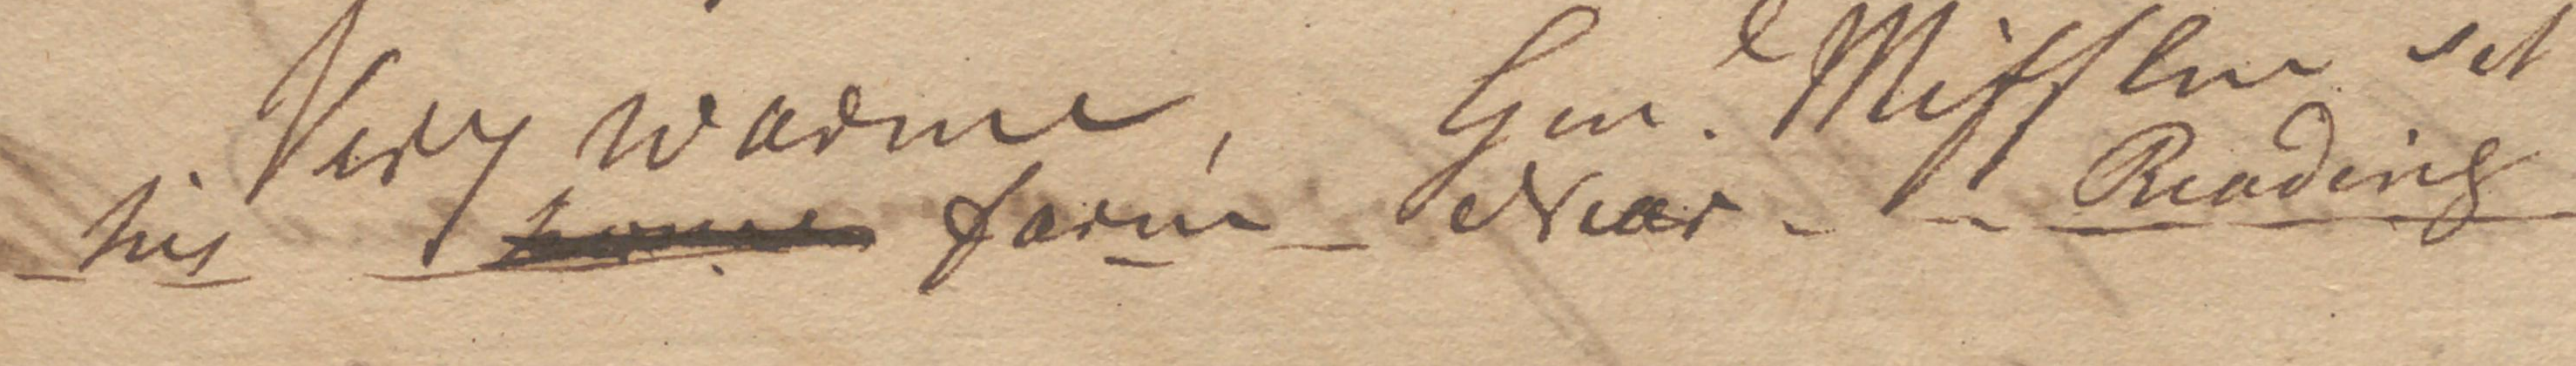his [______] farm Near Reading
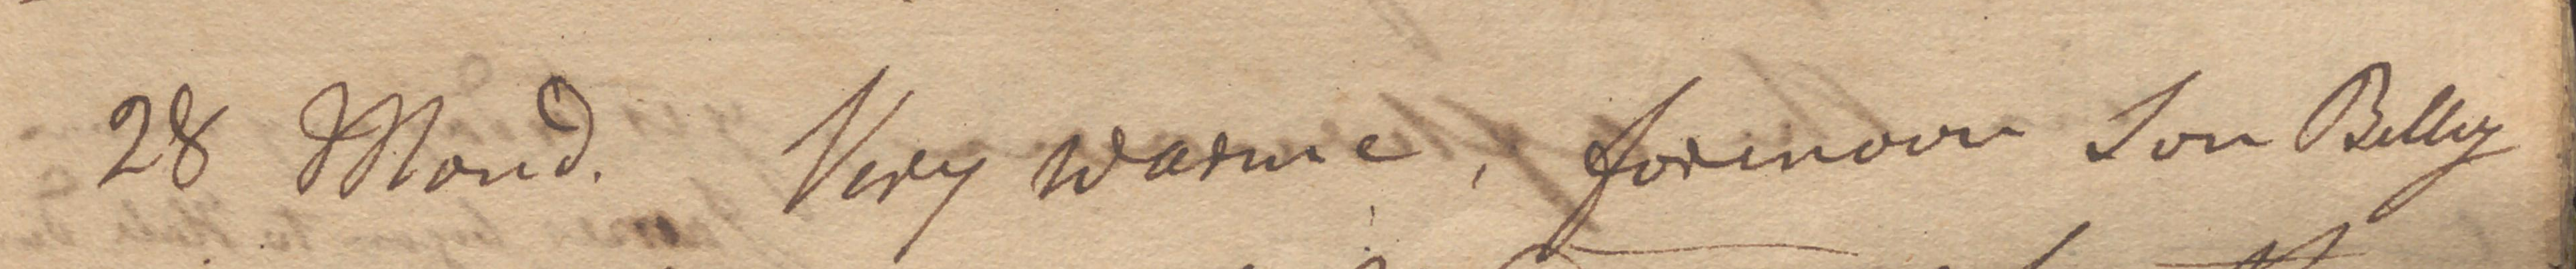28 Mond. Very warme, forenoon Son Billy
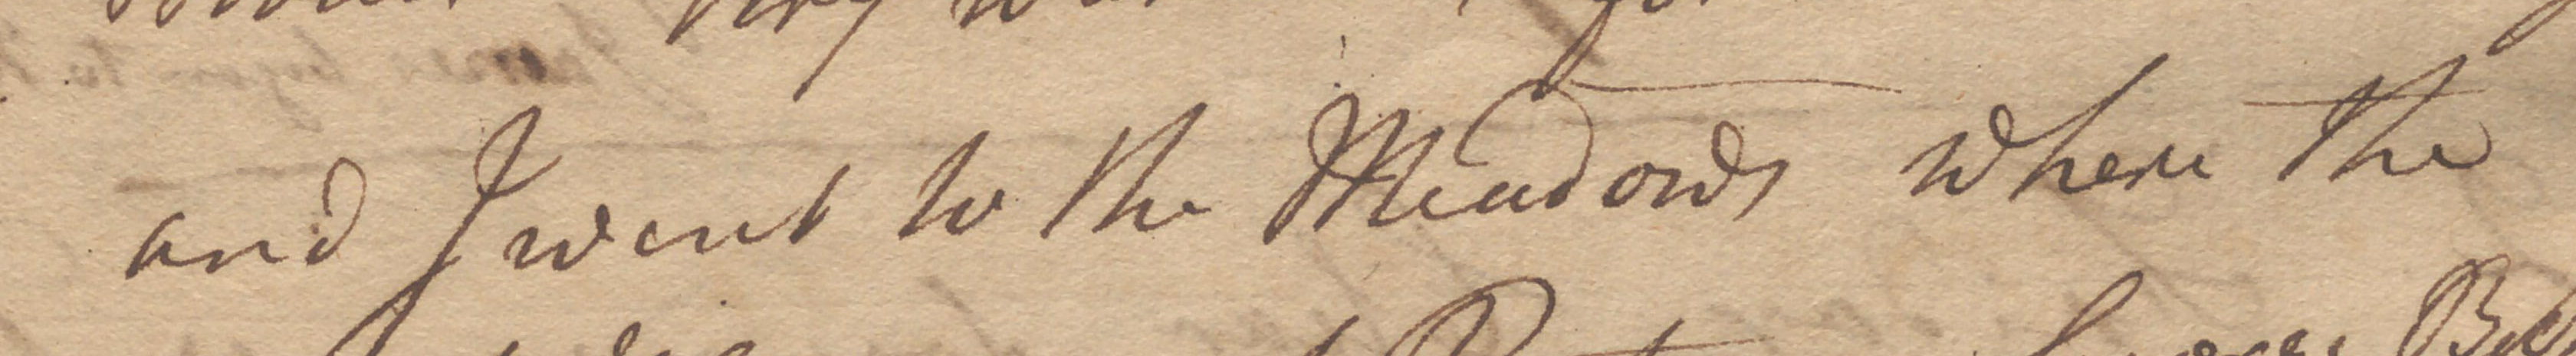and I went to the Meadows where the
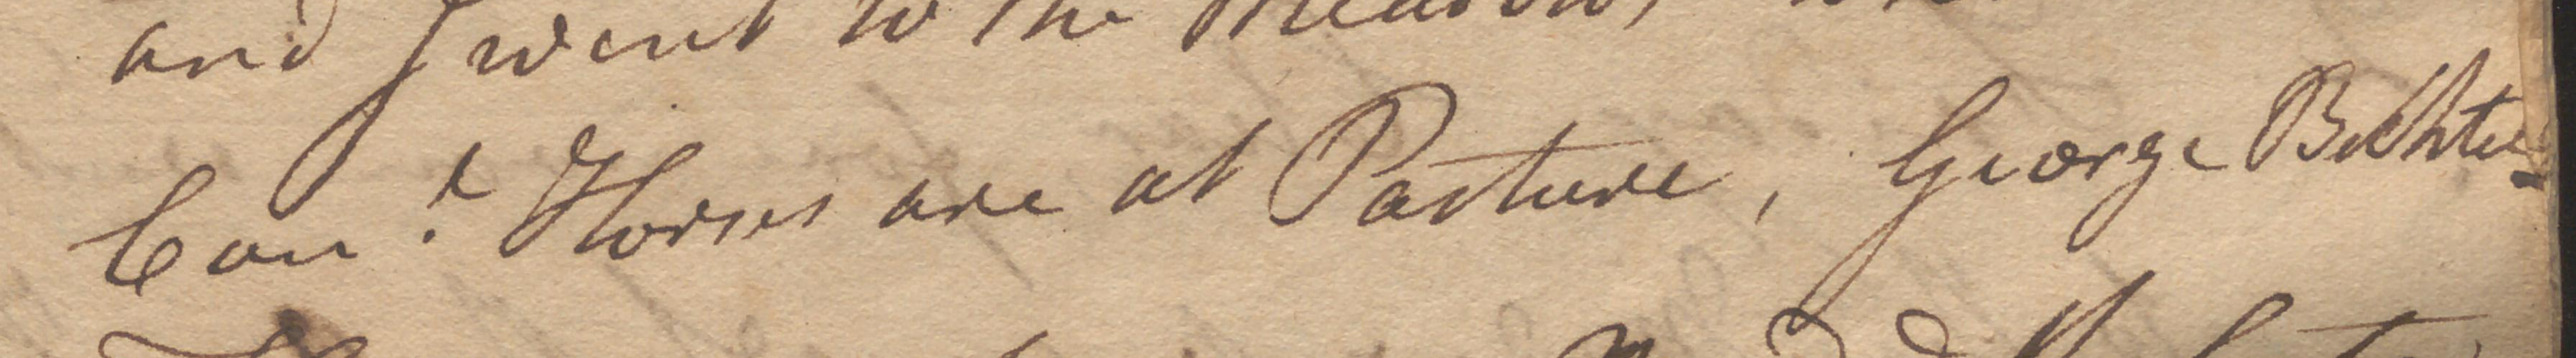Con^l. Horses are at Pasture, George Bechtel
